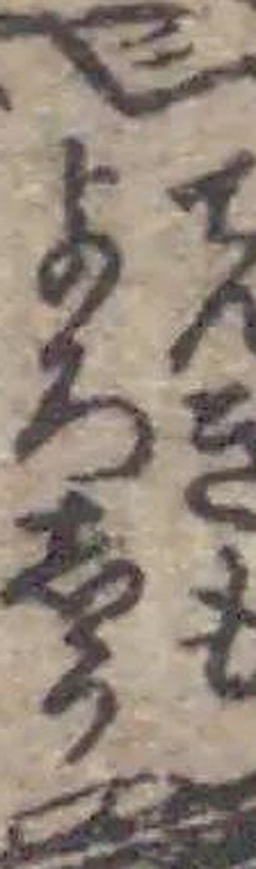よろしう
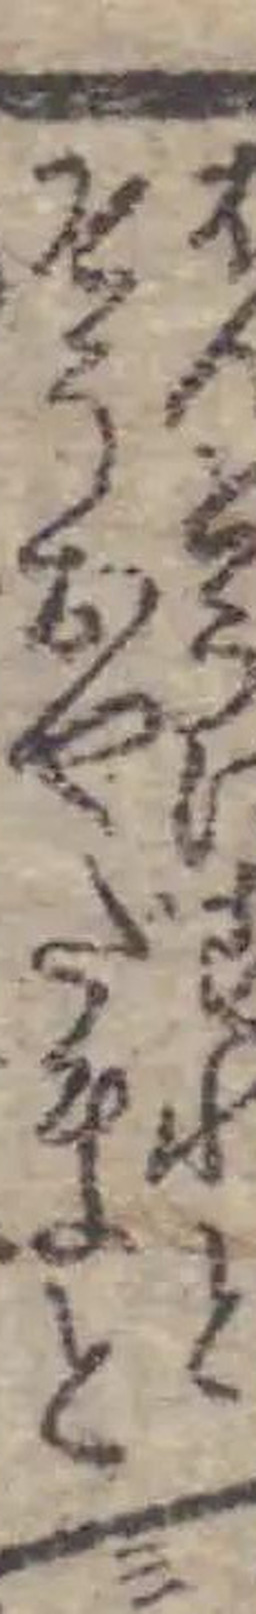そうおやだまと
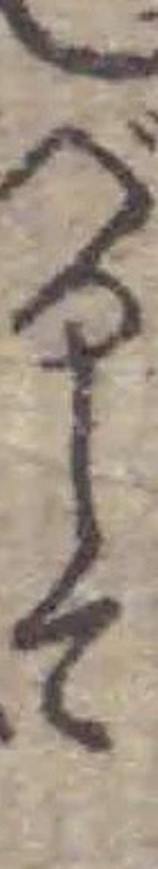べつして
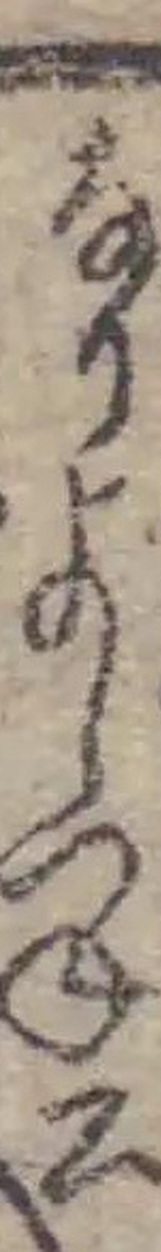なりよしつね公
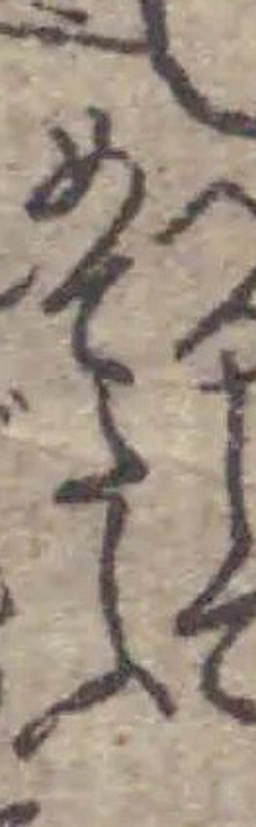めてたふ
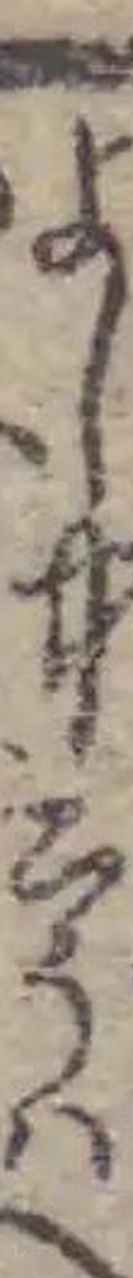よし中こうは
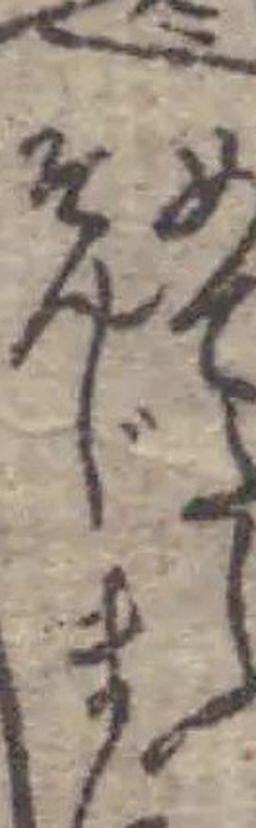そんじます
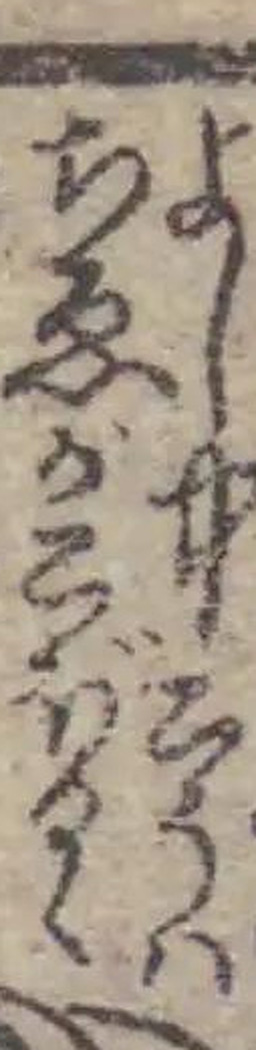ちゑがこぼるゝ
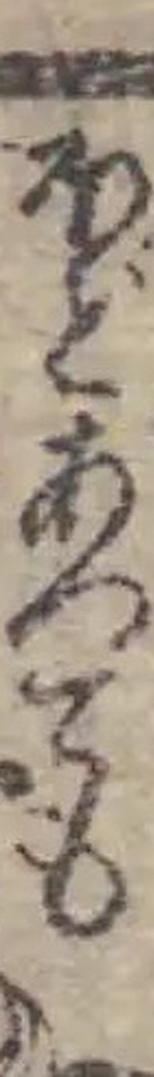ほどあつても
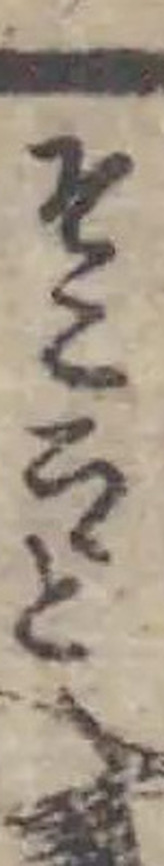そここゝと
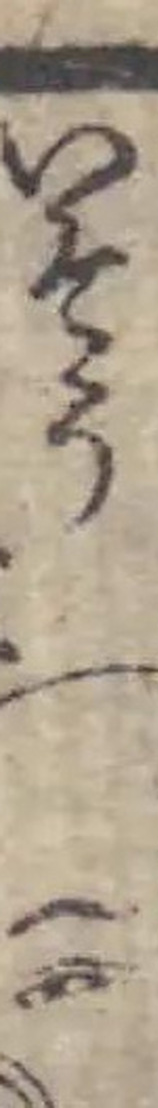いそう
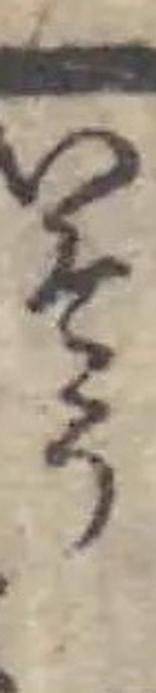いそう
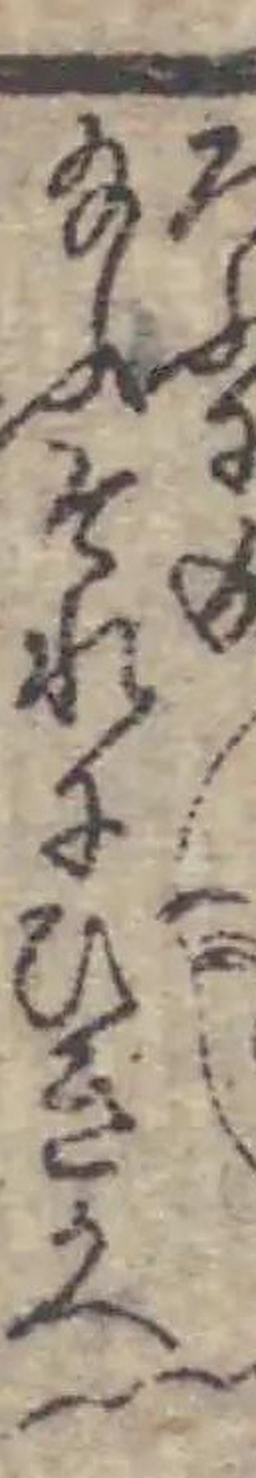給ふそれにひきかへ
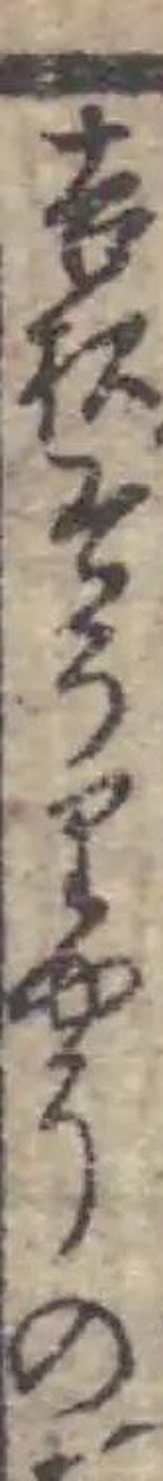吉松そうりやうの
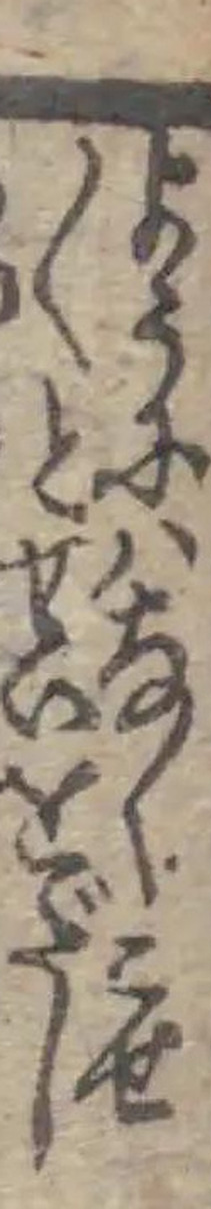ようにはなくこせ
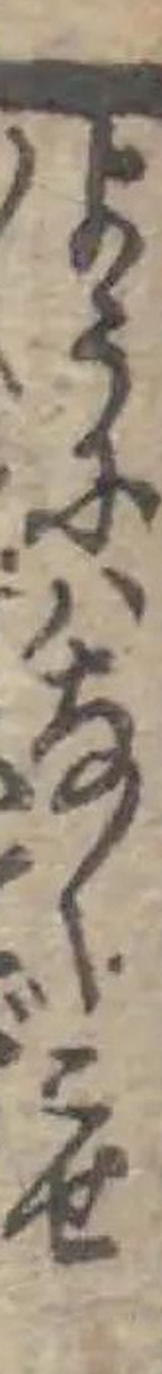ようにはなくこせ
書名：津以曽無弟の甚六 3巻
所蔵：国立国会図書館 National Diet Library, JAPAN
